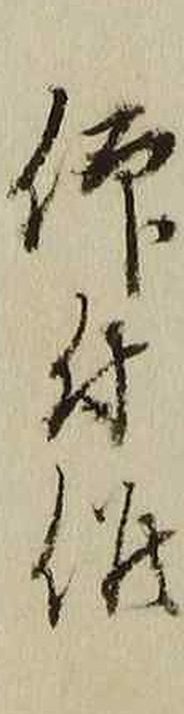仰付候
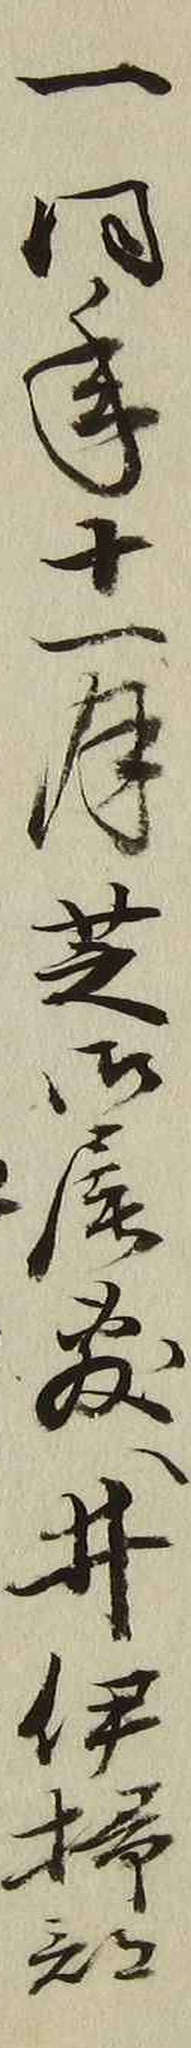一同年十一月芝御屋敷へ井伊掃部
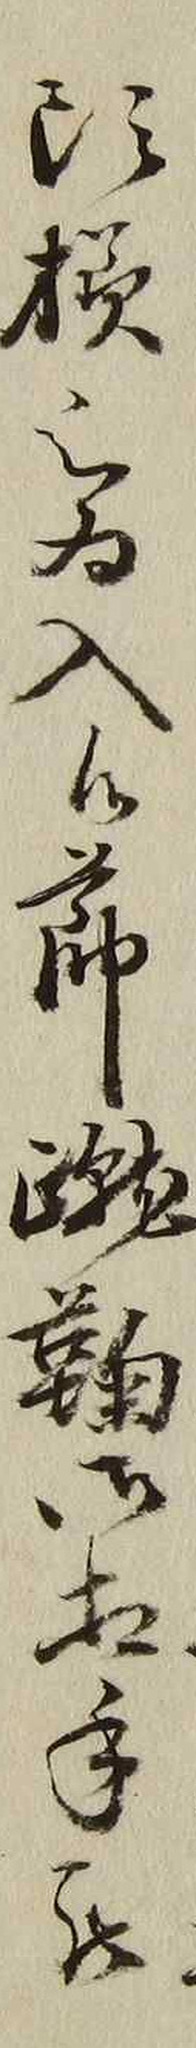頭様被為入候節蹴鞠御相手被
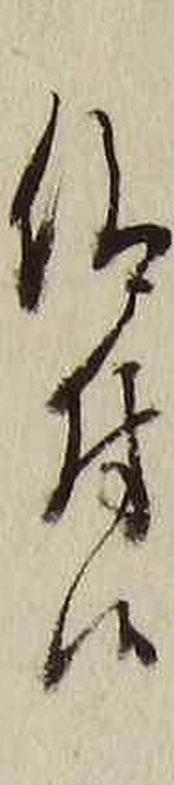仰付候
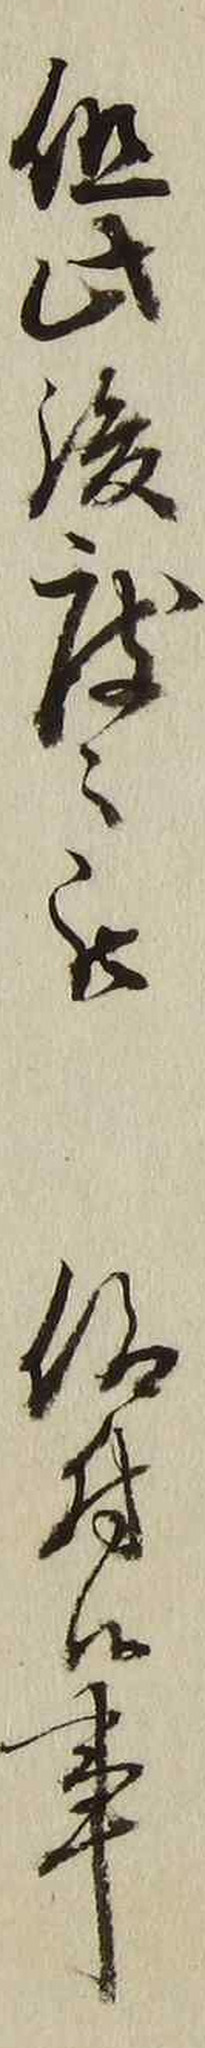但此後度々被仰付候事
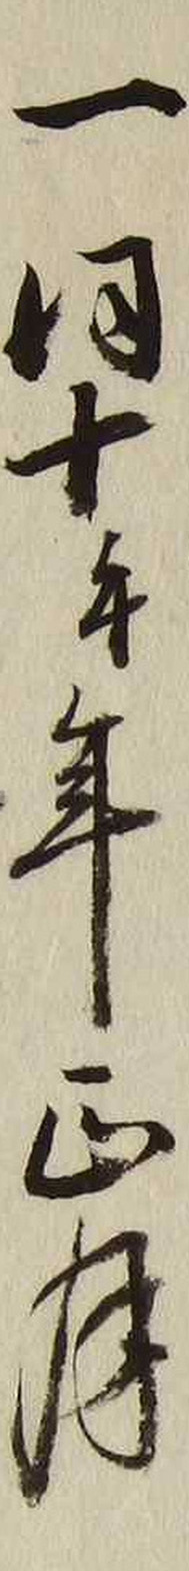一同十午年正月
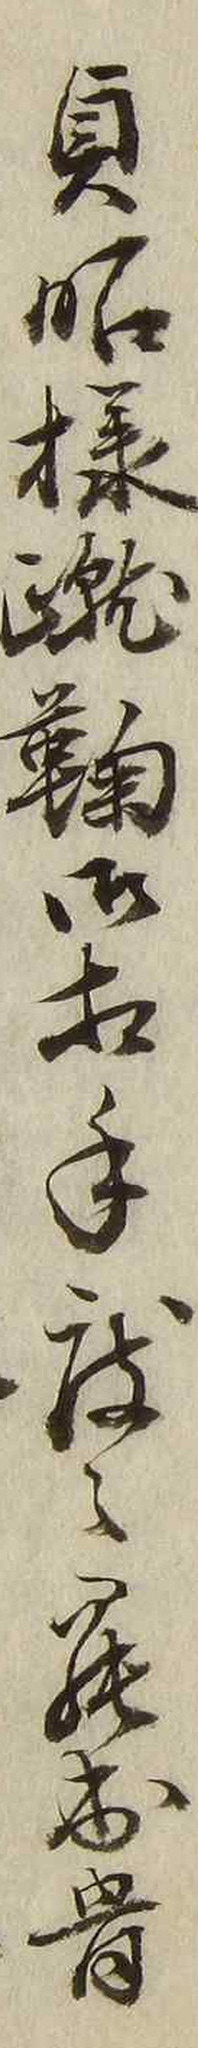貞昭様蹴鞠御相手度々罷出骨
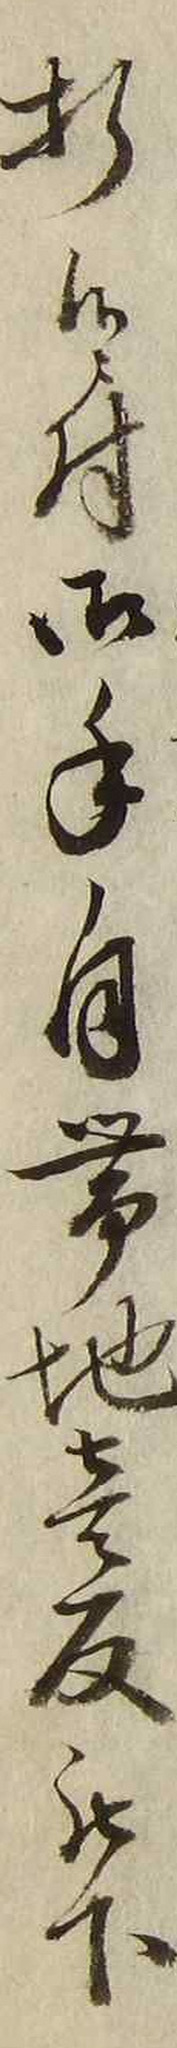折候ニ付御手自帯地壱反被下

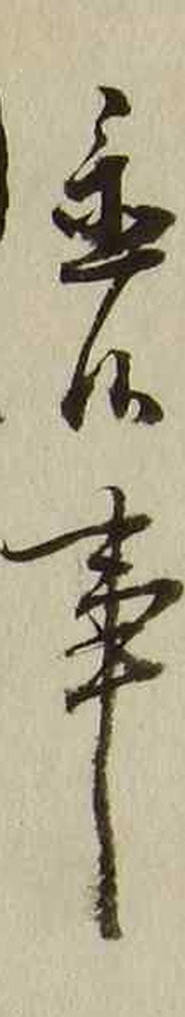置候事
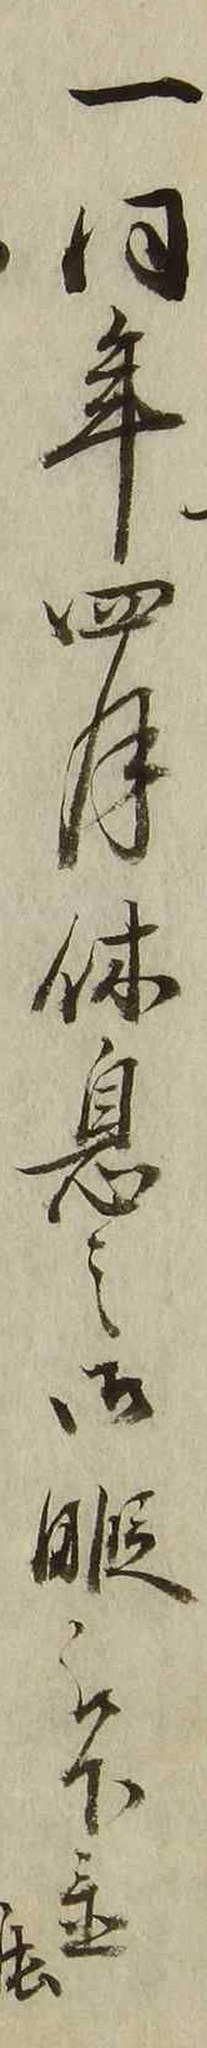一同年四月休息之御暇被下置罷
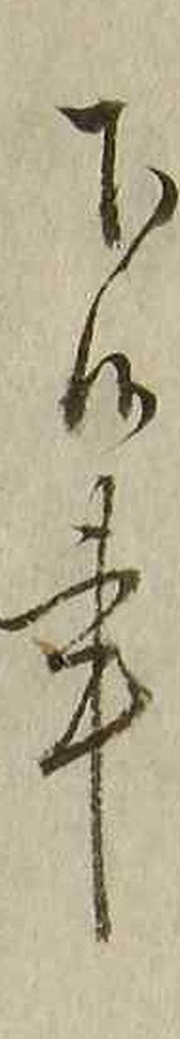下候事
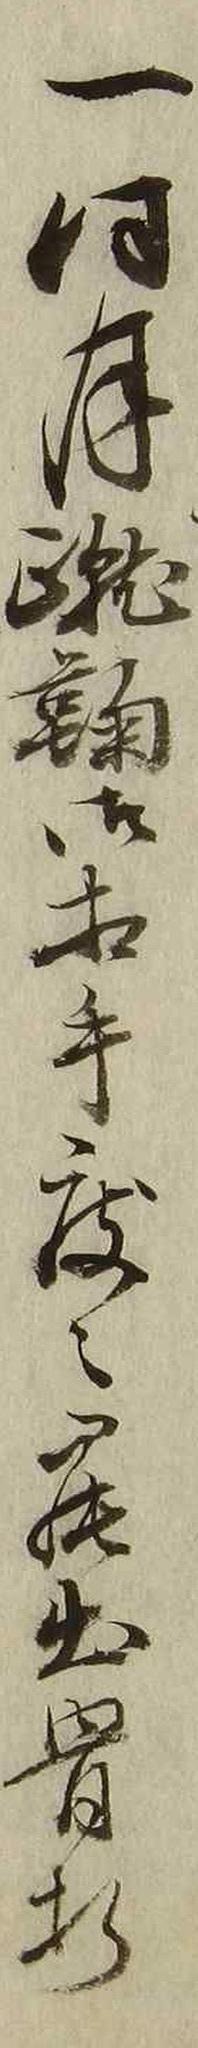一同月蹴鞠御相手度々罷出骨折
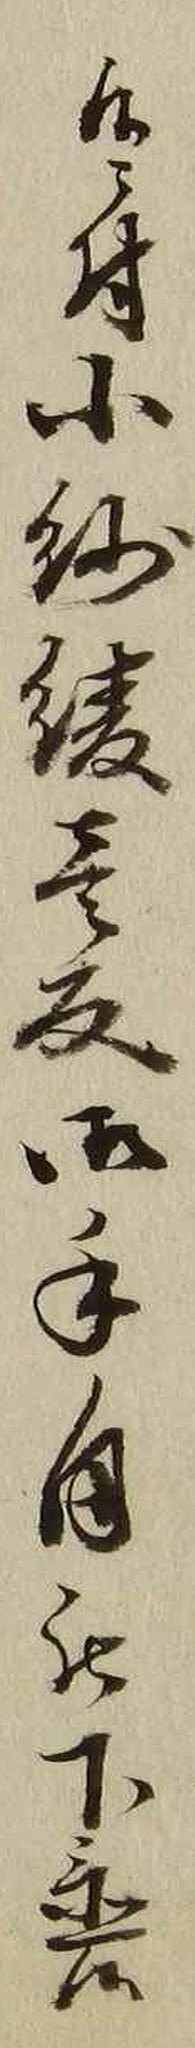候ニ付小紗綾壱反御手自被下置候
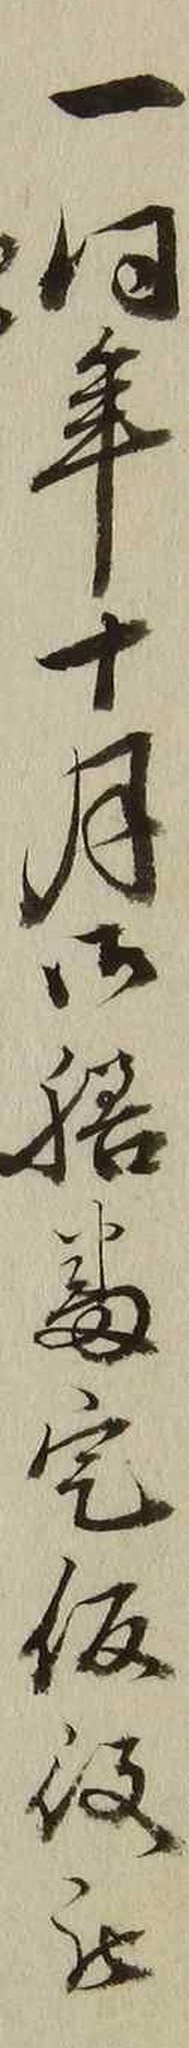一同年十月御膳番定仮役被
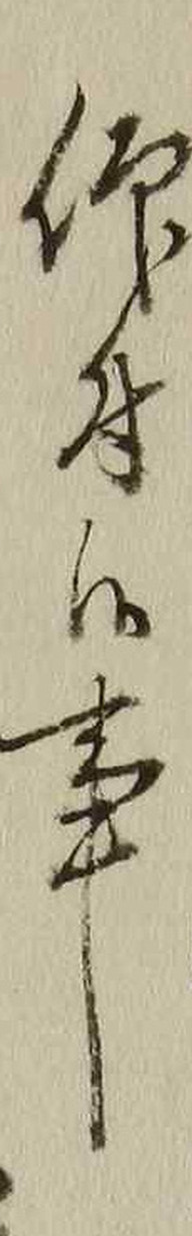仰付候事
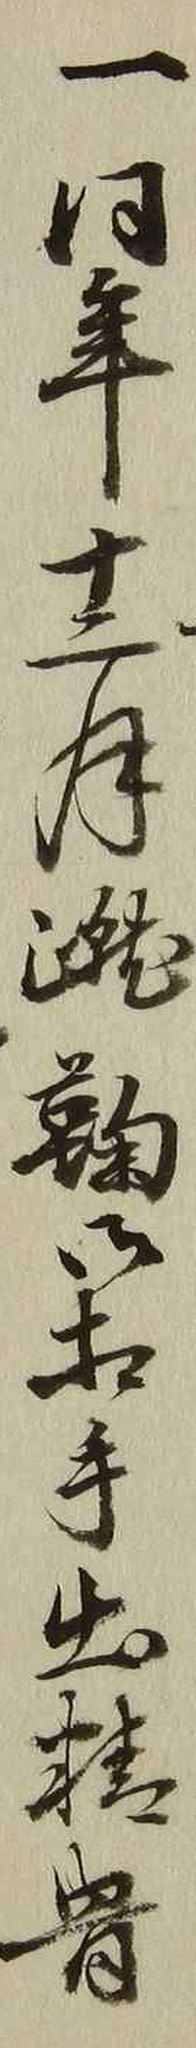一同年十二月蹴鞠御相手出精骨
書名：諸士系譜　巻之36　は之部4
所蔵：会津若松市立会津図書館
